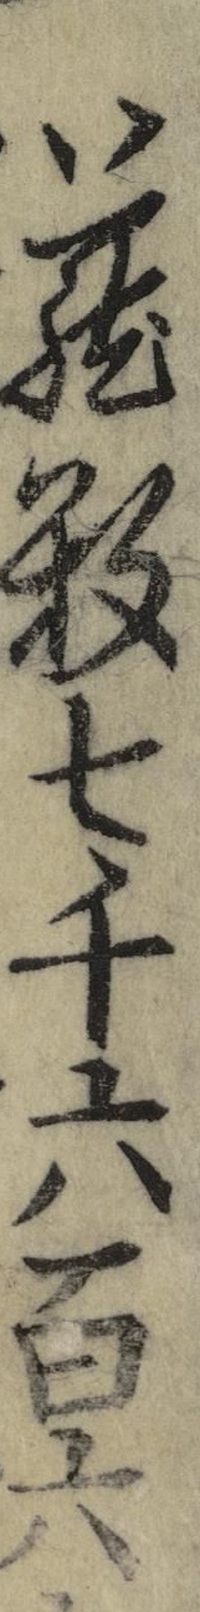蔵数七千六百六ケ所
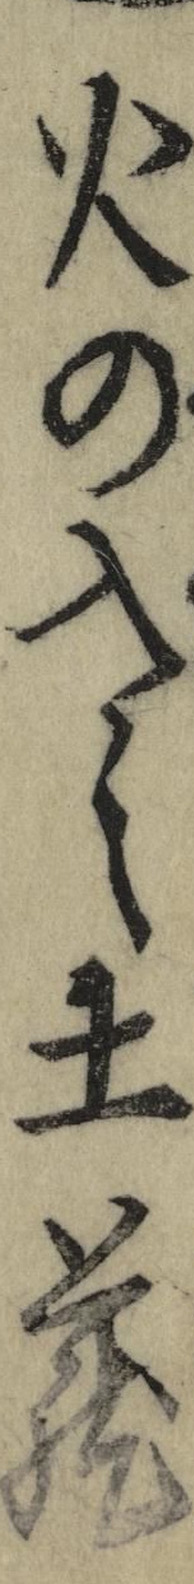火の入之土蔵
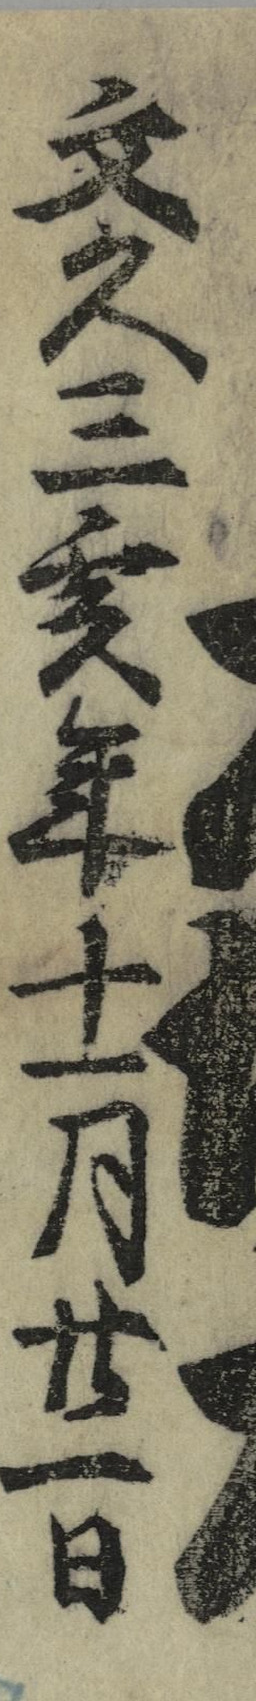文久三亥年十一月廿一日
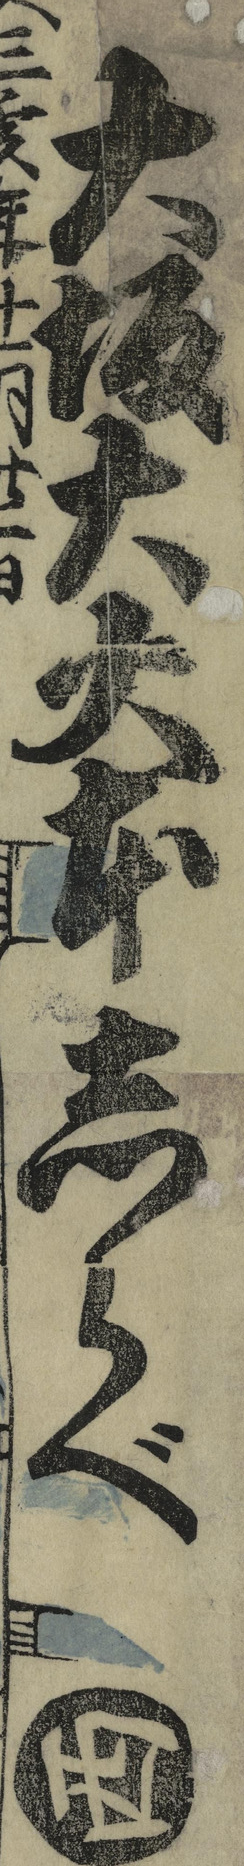大坂大火本しらべ
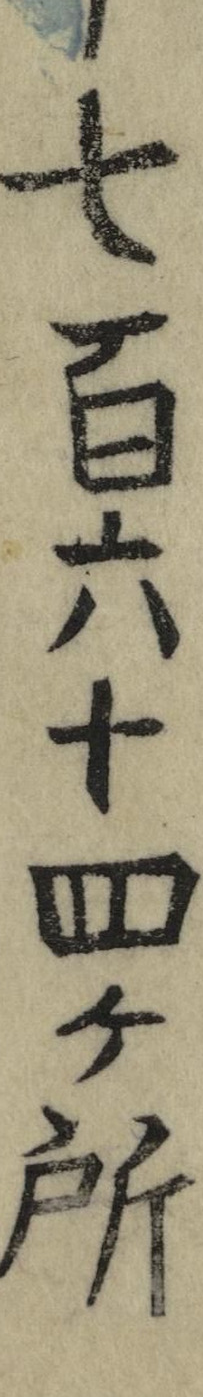七百六十四ケ所
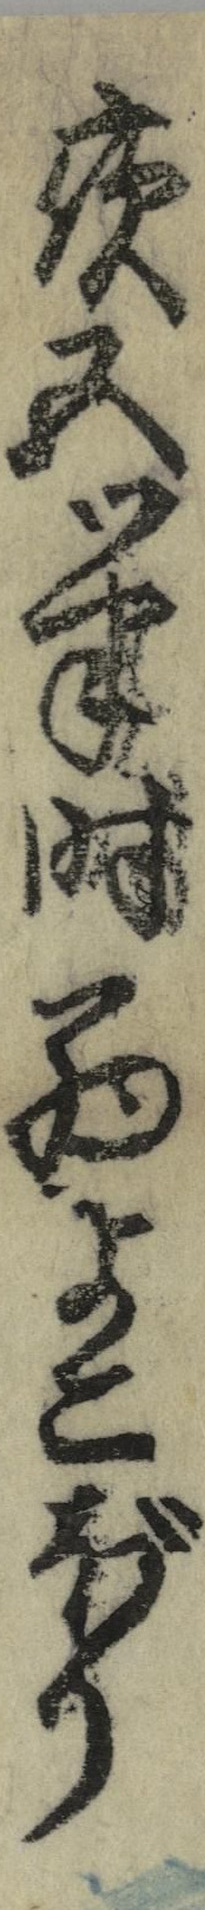夜五ツ半時西よこぼり
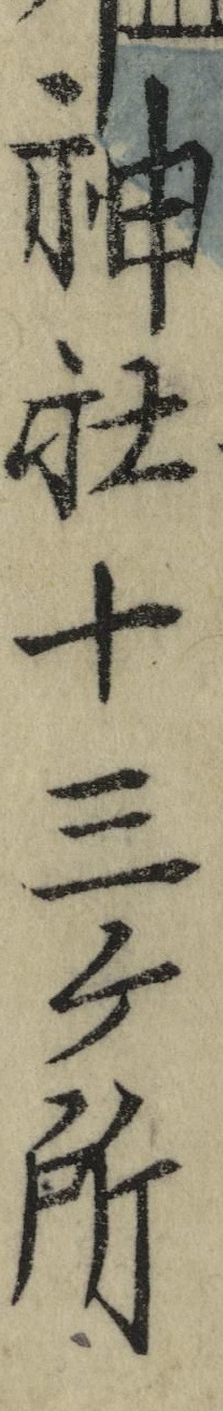神社十三ケ所
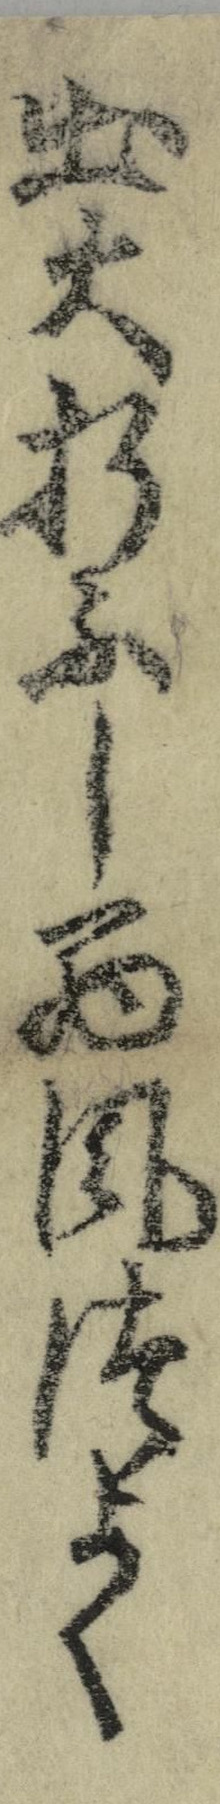出火折ふし西風つよく
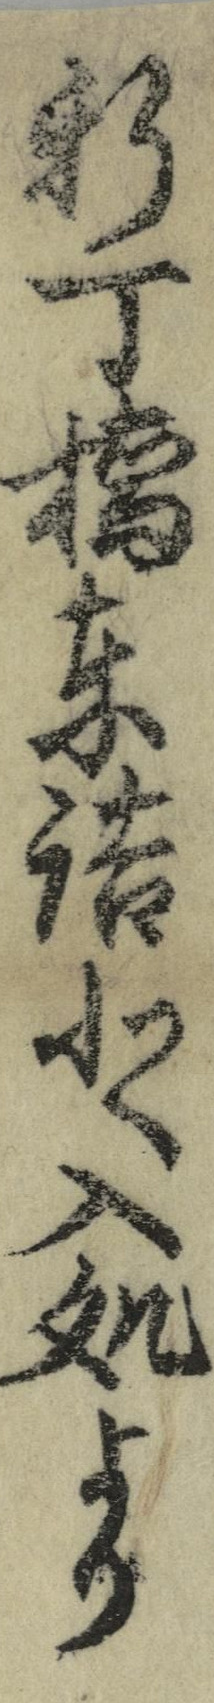軒丁橋東詰北へ入処より
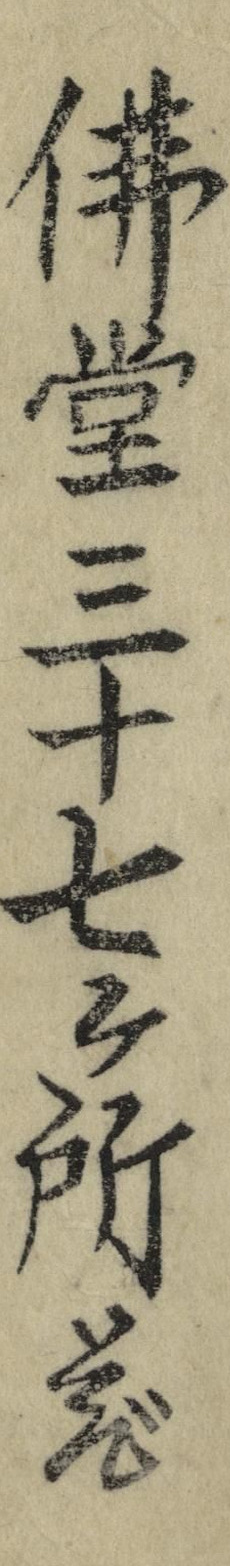仏堂三十七ケ所とぞ
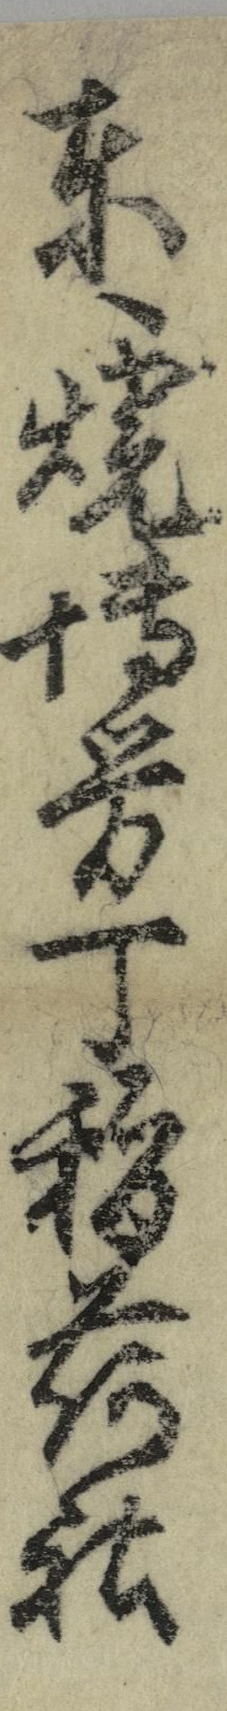東へ焼博労丁稲荷社
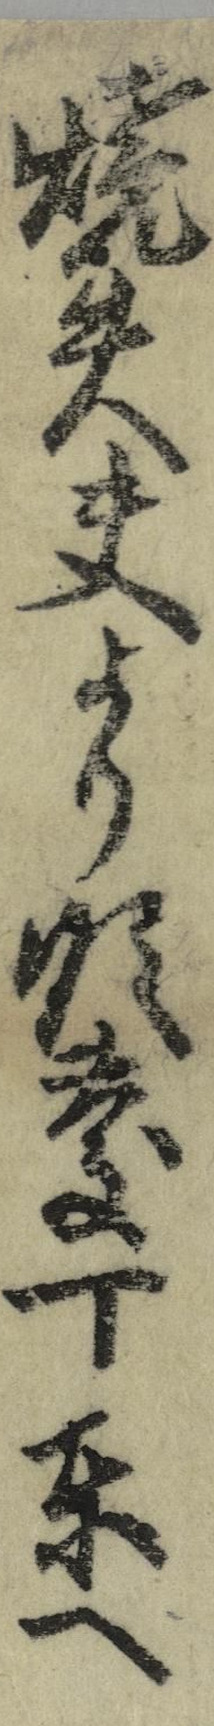焼失夫より順慶丁東へ
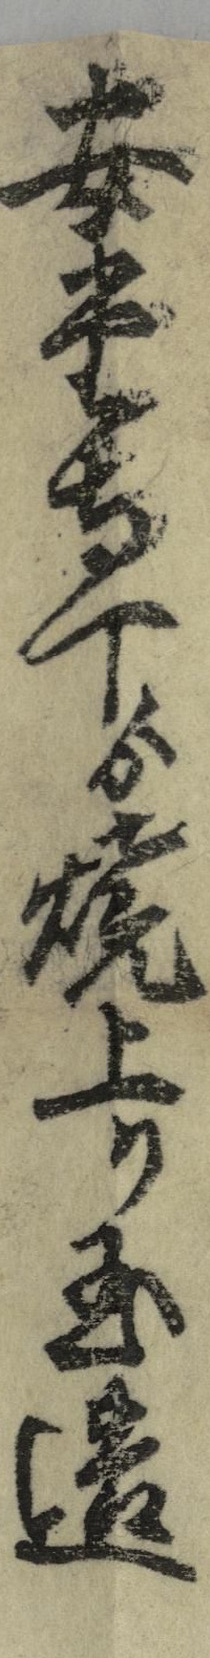安堂寺町ゟ焼上り玉造
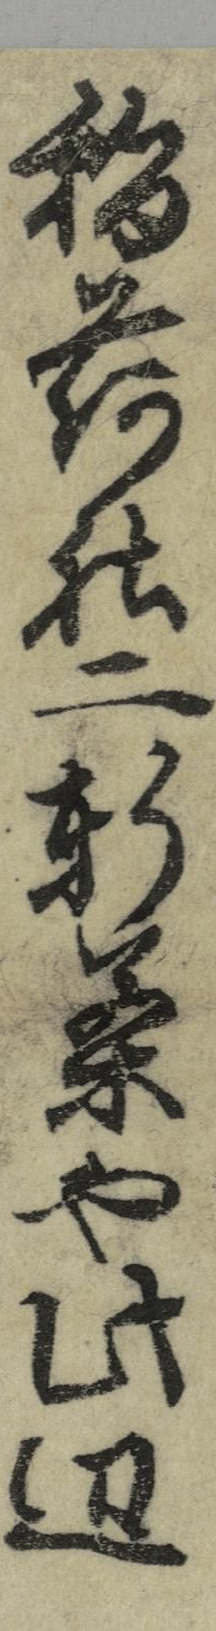稲荷社ニ軒茶や此辺
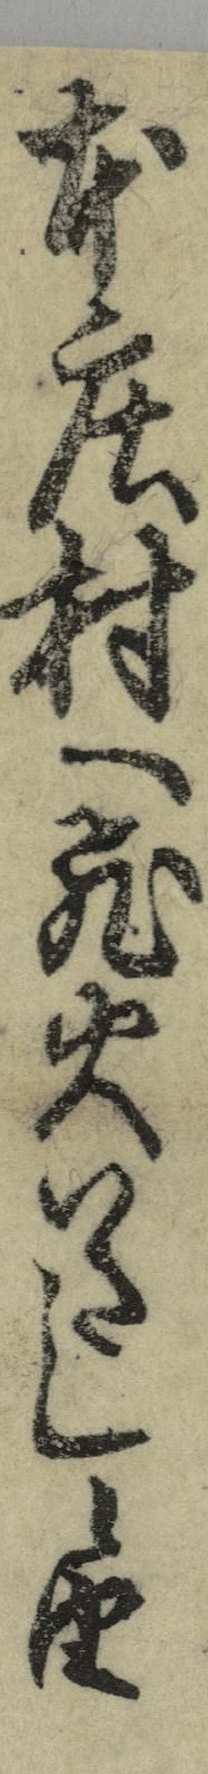本庄村へ飛火いたし之由
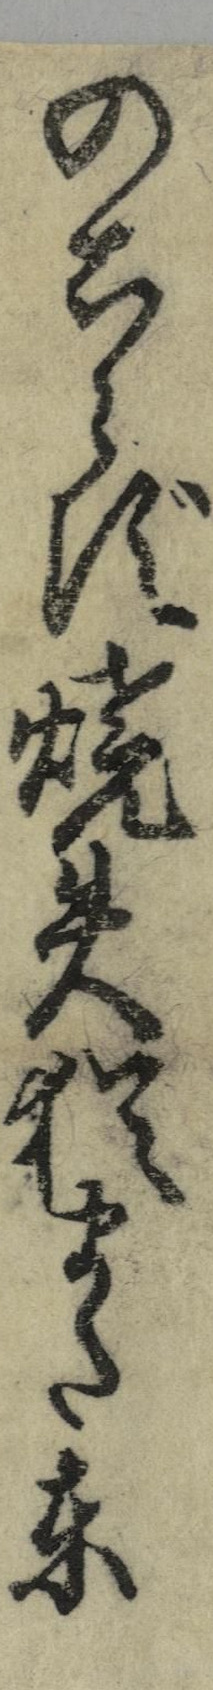のこらず焼失猶また東
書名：大坂大火本しらべ
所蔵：東京大学地震研究所図書室 Earthquake Research Institute Library, The University of Tokyo, JAPAN
